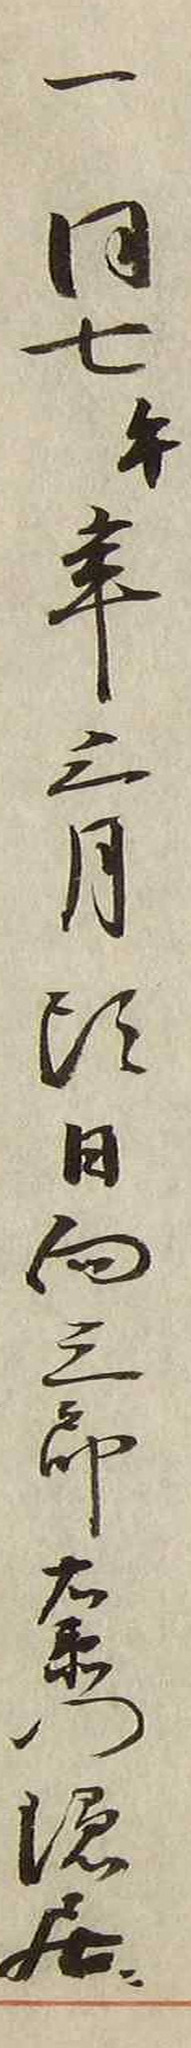一同七午年三月頃日向三郎右衛門隠居ニ

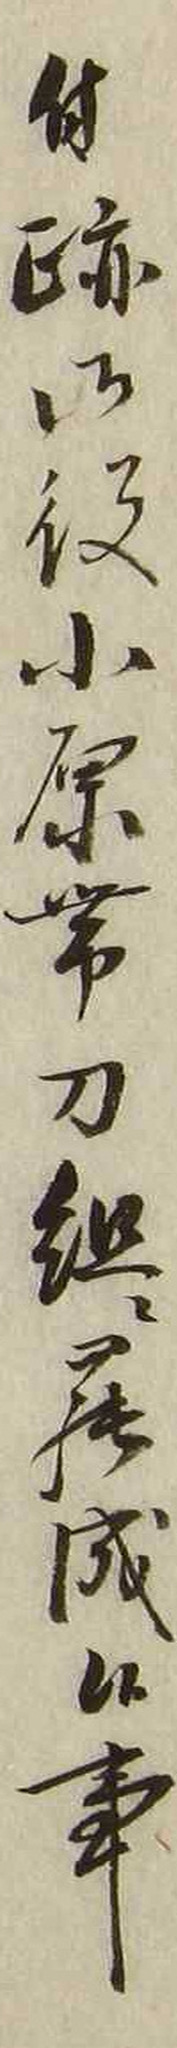付跡御役小原帯刀組ニ罷成候事
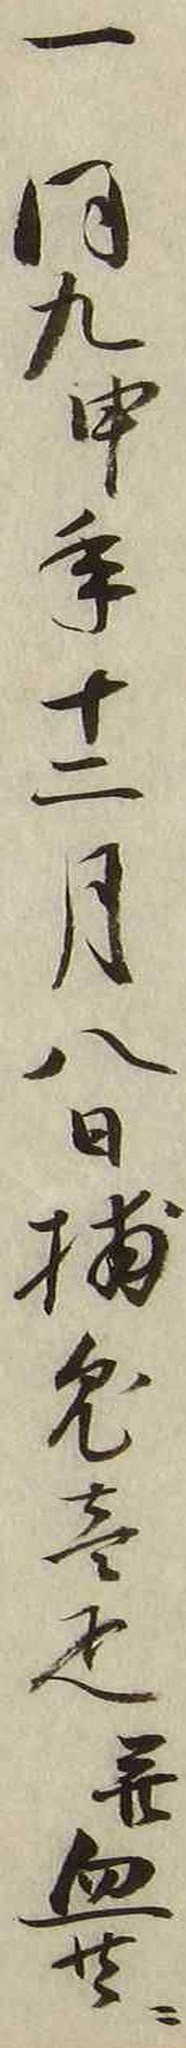一同九申年十二月八日捕兎壱疋并血共ニ
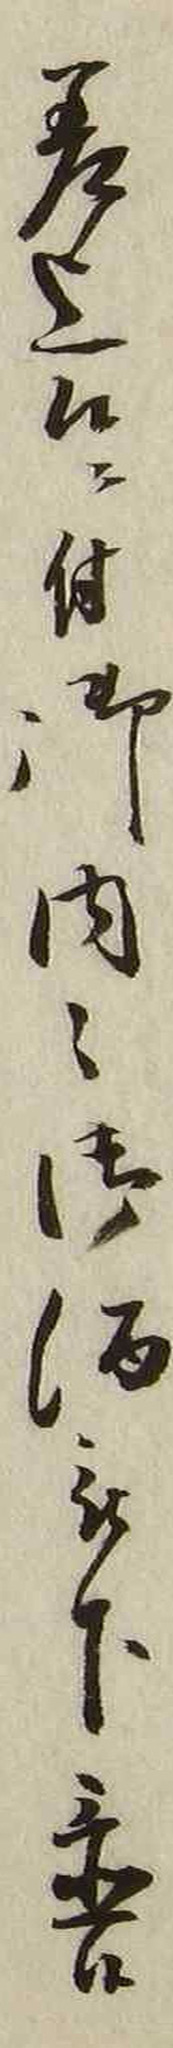差上候ニ付御内々御酒被下置候
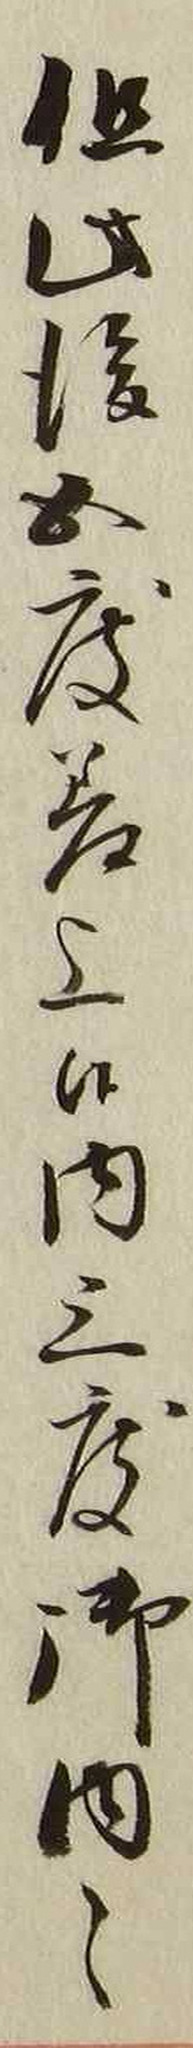但此後五度差上候内三度御内々
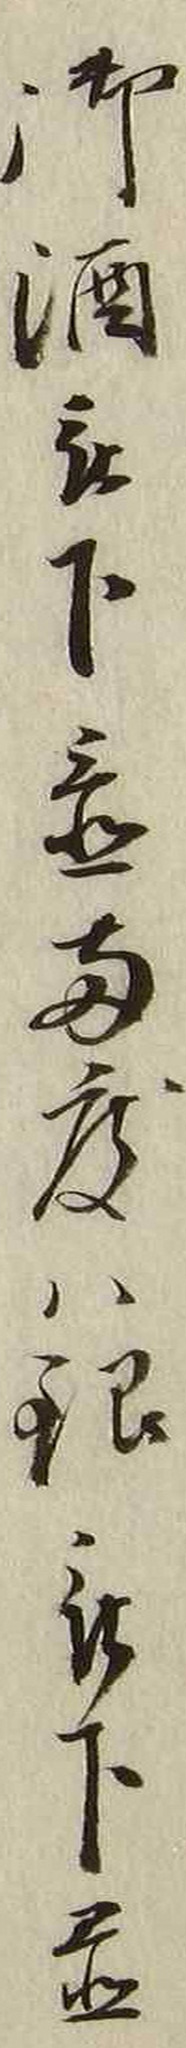御酒被下置両度ハ銀被下置
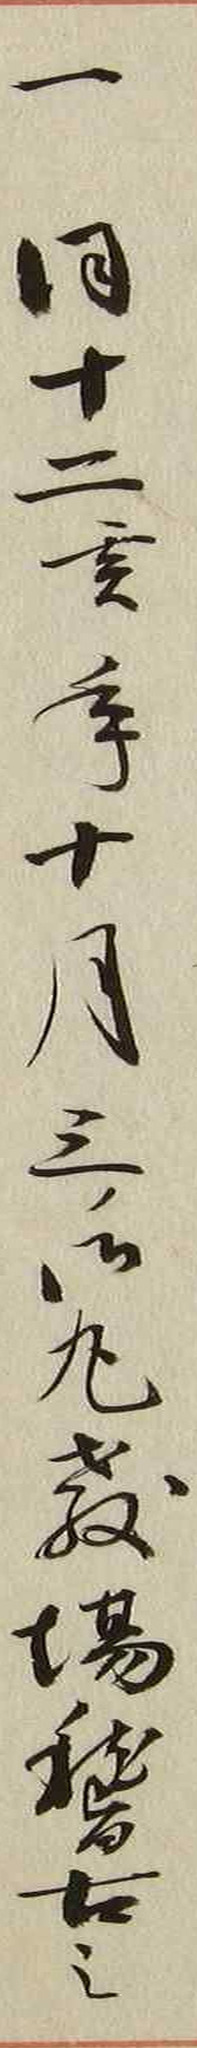一同十二亥年十月三ノ御丸教場稽古之
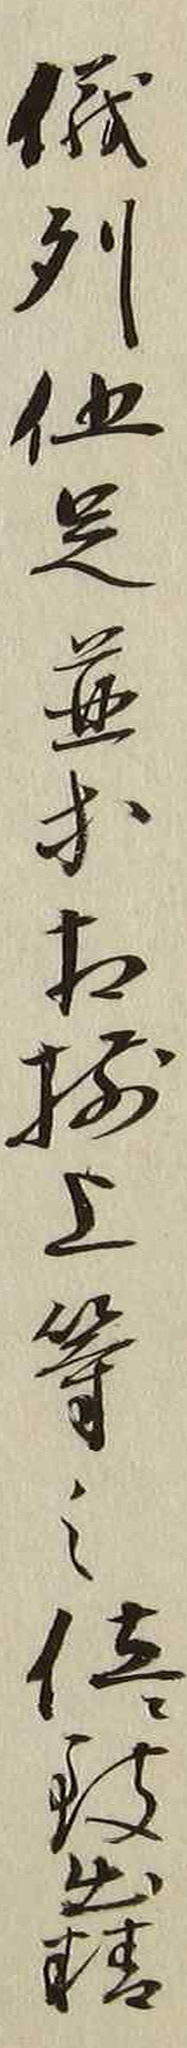儀列伍足並等相揃上等之位ニ致出精
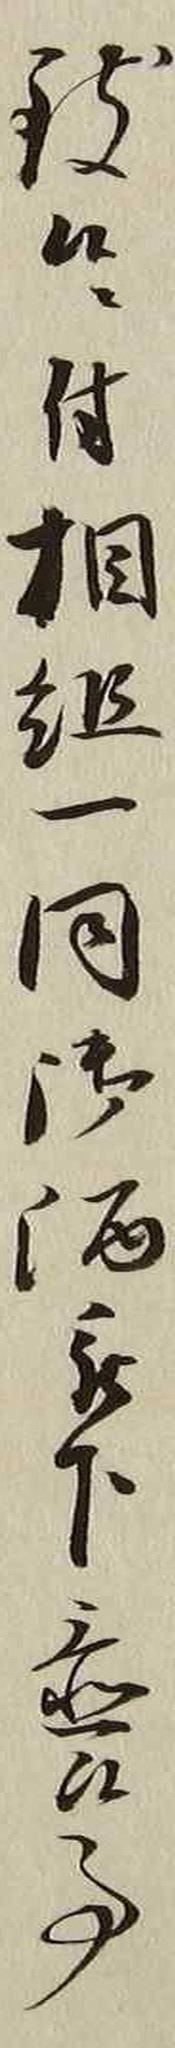致候ニ付相組一同御酒被下置候事
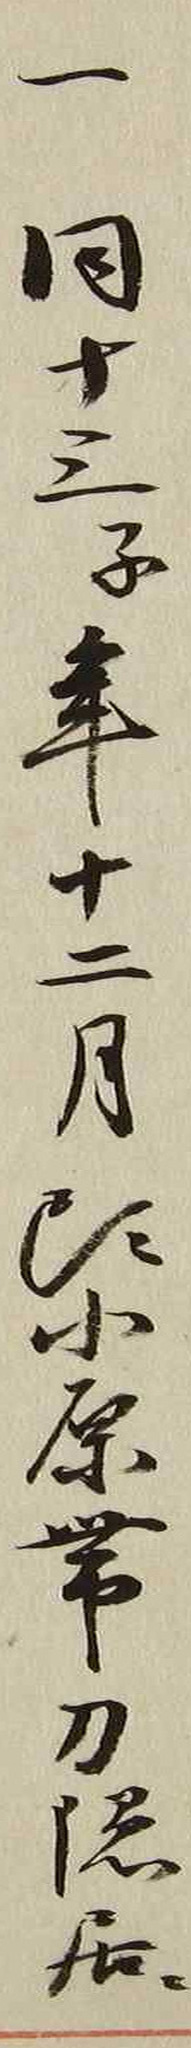一同十三子年十二月頭小原帯刀隠居ニ
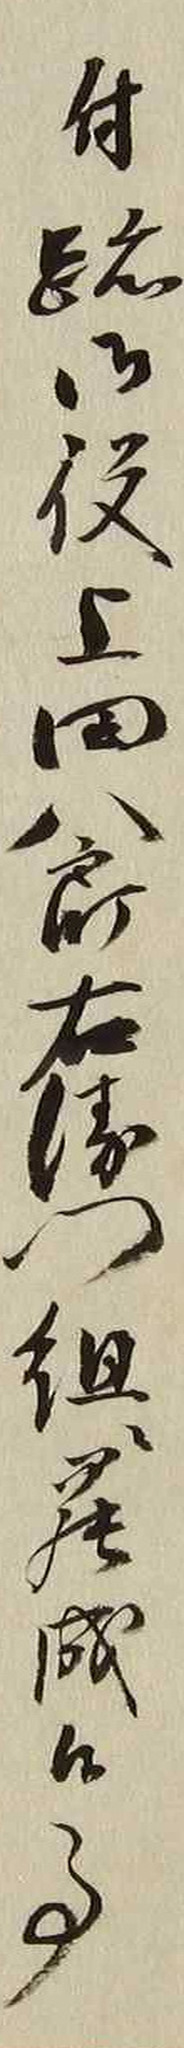付跡御役上田八郎右衛門組ニ罷成候事
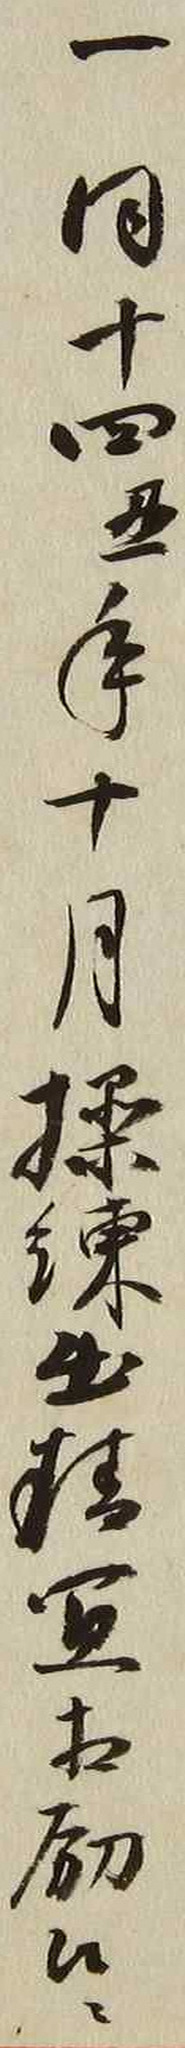一同十四丑年十月操練出精宜相励候ニ
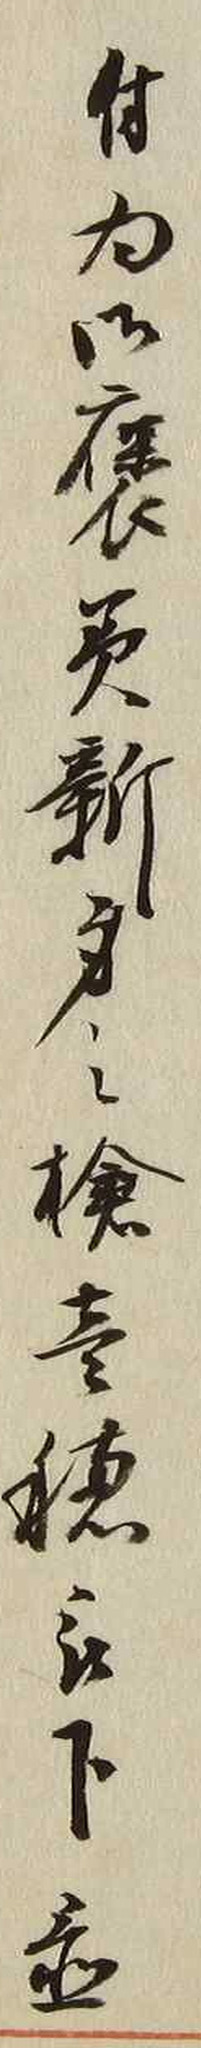付為御褒美新身之槍壱穂被下置
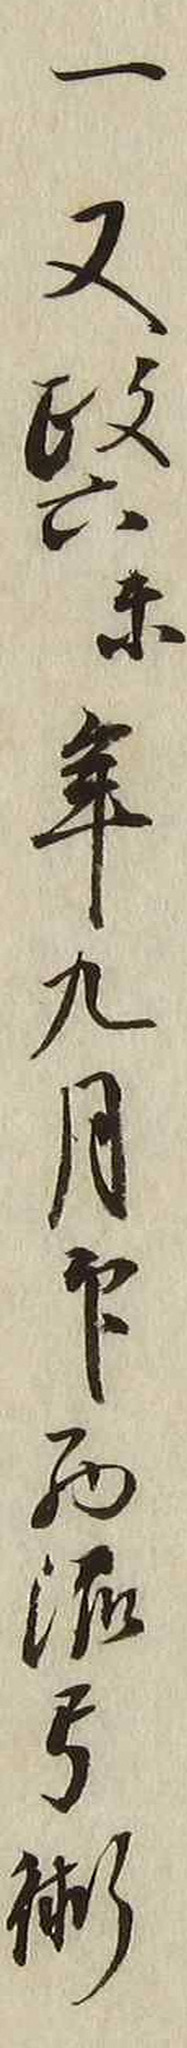一文政六未年九月印西流弓術
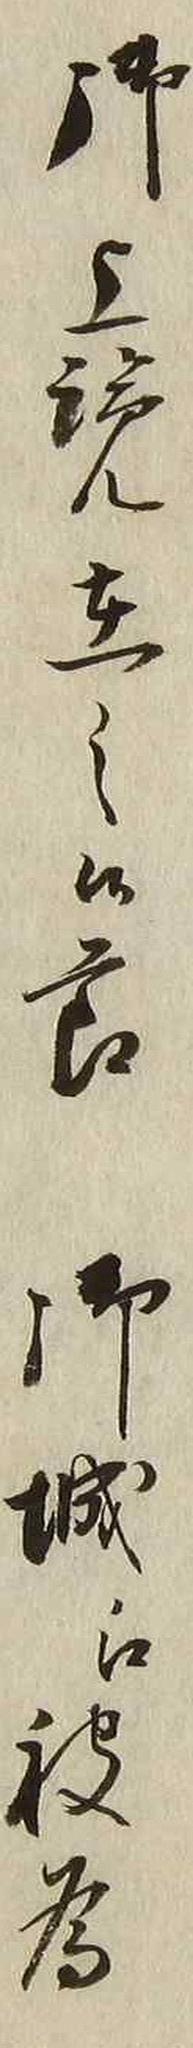御上覧在之候節御城江被為
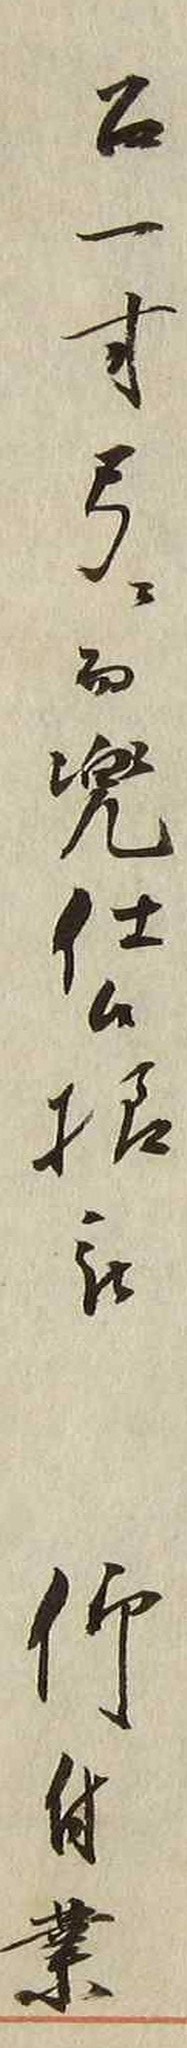召一寸弓ニ而兜仕候様被仰付業
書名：諸士系譜　巻之22　い之部22
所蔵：会津若松市立会津図書館
